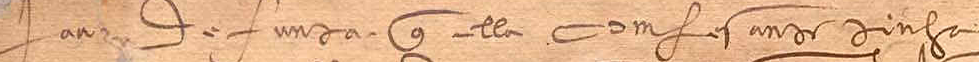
Jaa defunta q̄ ella comfesante tinha
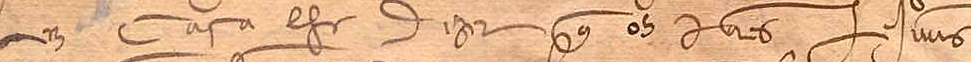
em Casa lhe dizer q̄ os tāes JeJūus
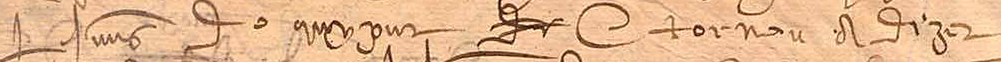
JeJūus do quypur de e tornou A dizer
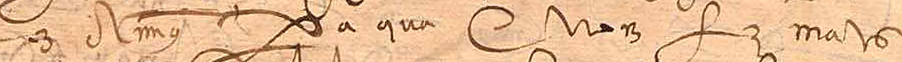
dez Ann̄ꝯ ꝑa qua e Nom fez majs
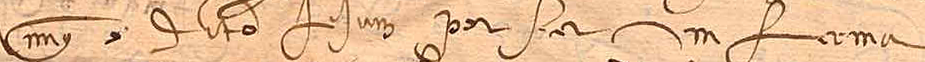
Ann̄ꝯ o dito JeJum por seer emferma
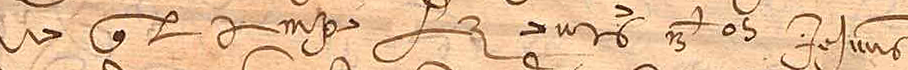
No q̄l tempo fez outos mtos JeJūus
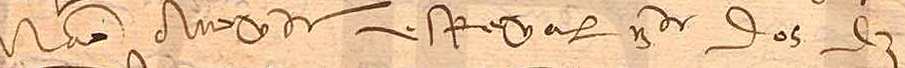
Não A noyte especyalmte dos dez
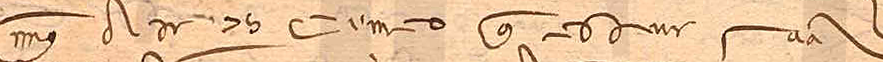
Ann̄ꝯ Ate os Cimco q̄ esteue saā
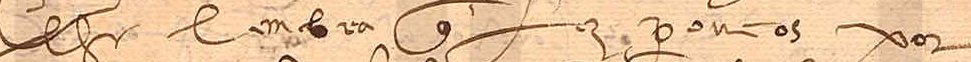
lhe lembra q̄ fez poucos por
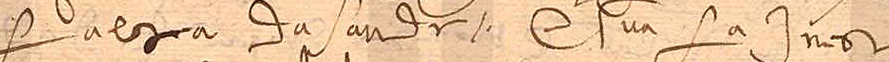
falta da saude /. e sua fa Jnes
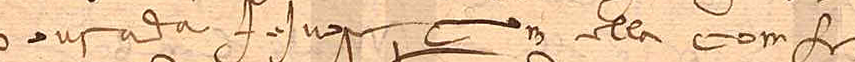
pousada JeJuou Com ella comfe
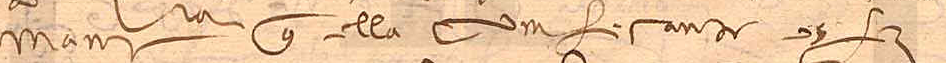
manrra q̄ ella Comfesante os fez
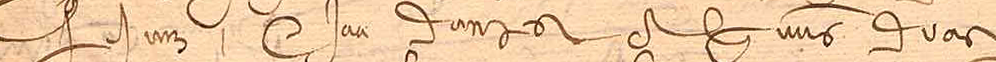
JeJum / e Jaa dantes Alguūs dias
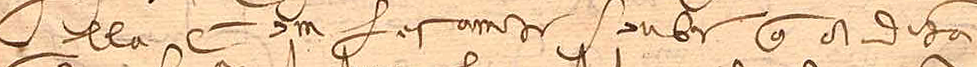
ella Comfesamte soube q̄ A dit̄a
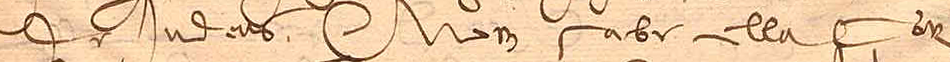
de Judeus e Nom sabe ella Con
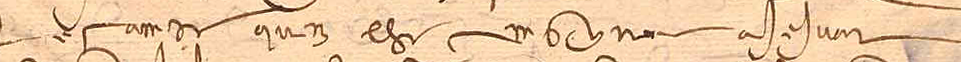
fesamte quem lhe ensynou a JeJuar
